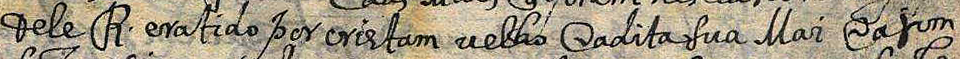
Dele R. era tido por cristam uelho e a dita sua Mai e asim
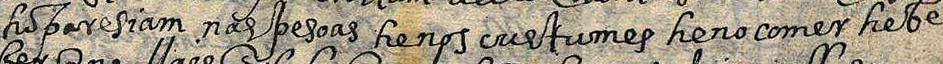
ho paresiam nas pesoas he nos custumes he no comer he be
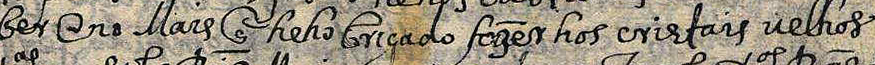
ber e no Mais q̄ he hobrigado fazer hos cristais uelhos
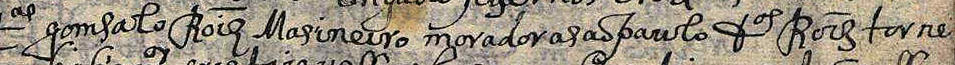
tas gomsalo Roīz Masineiro morador a saõ paulo Dos Roīz torne
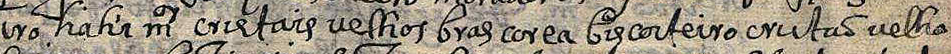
iro hahi mor cristais uelhos bras corea biscoiteiro cristaõ uelho
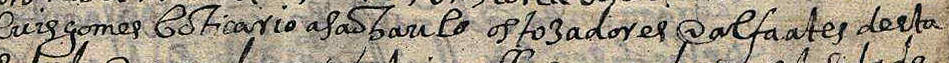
luis gomes boticario a saõ paulo os tozadores e alfaates desta
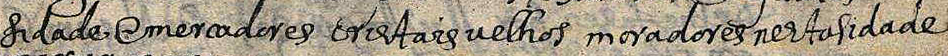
sidade e mercadores cristais uelhos moradores nesta sidade
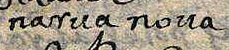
na rua noua
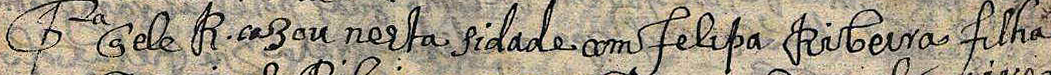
Pra q̄ elle R. cazou nesta sidade com felipa Ribeira filha
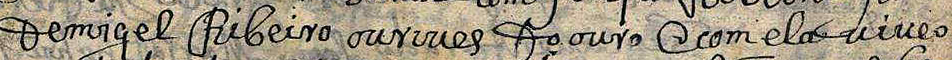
De migel Ribeiro ouriues Do ouro e com ela uiueo
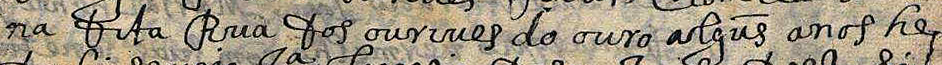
na Dita Rua Dos ouriues Do ouro algūs anos he
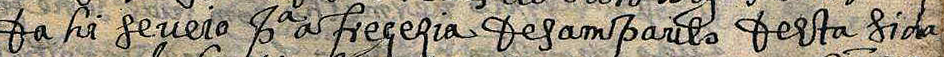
Dahi se ueio pa a fregezia De sam paulo Desta sida
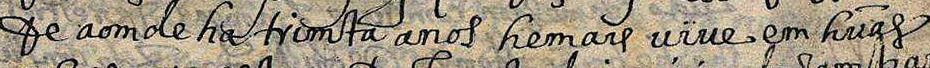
De aomde ha trinta anos he mais uiue em hūas
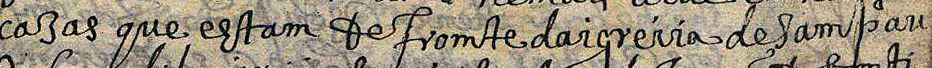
cazas que estam Defromte da igreiia de sam pau
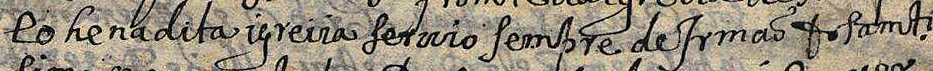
lo he na dita igreiia seruio sempre de Jrmaõ Do samti
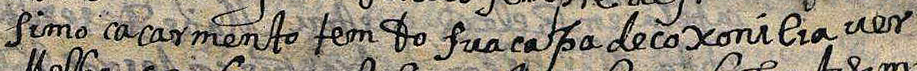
simo cacarmento temDo sua capa de coxonilia uer
